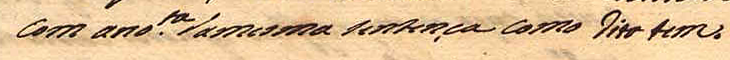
com a no.ta da mesma sentença como dito tem.
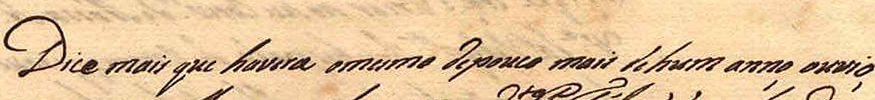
Dice mais que havera o mesmo de pouco mais de hum anno ouvio,
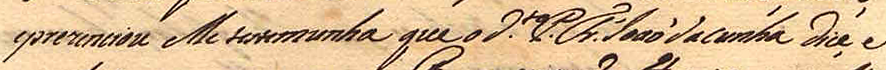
e prezenciou elle testemunha que o d.to P. Fr. Ioaõ da cunha dice, e
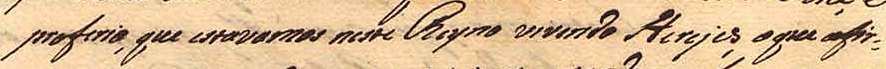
proferio, que estavamos neste Reyno vivendo Herejes, o que afir
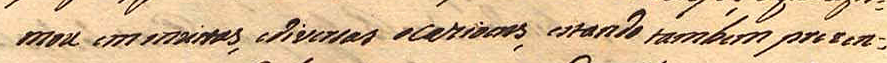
mou em muitas, e diversas ocazioens, estando tambem prezen
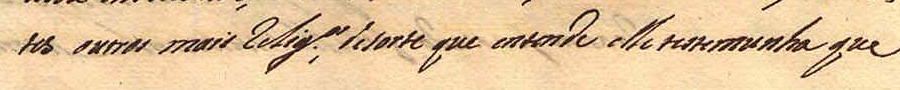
tes outros mais Relig.os, de sorte que entende elle testemunha que
